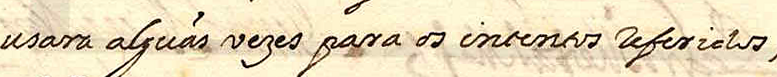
usara alguās vezes para os intentos referidos,
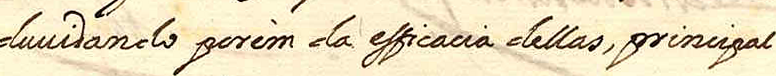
duuidando porèm da efficacia dellas, principal
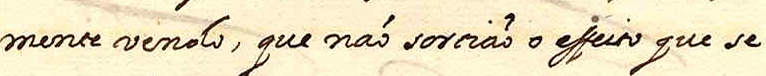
mente vendo, que naõ sortiaõ o effeito que se
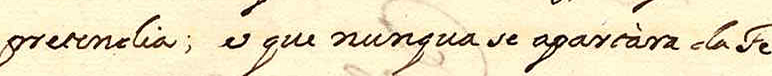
pretendia; e que nunqua se apartàra da Fe
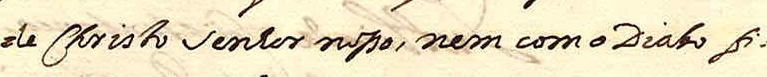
de Christo Senhor nosso, nem com o Diabo fi
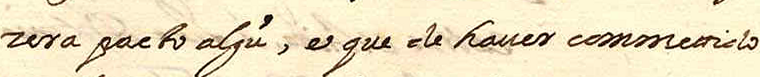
zera pacto algũ, e que de hauer commettido
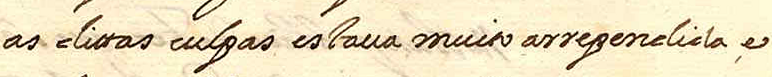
as dittas culpas estaua muito arrependida e
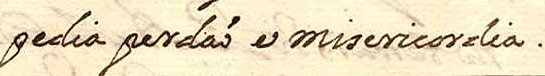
pedia perdaõ e misericordia.
